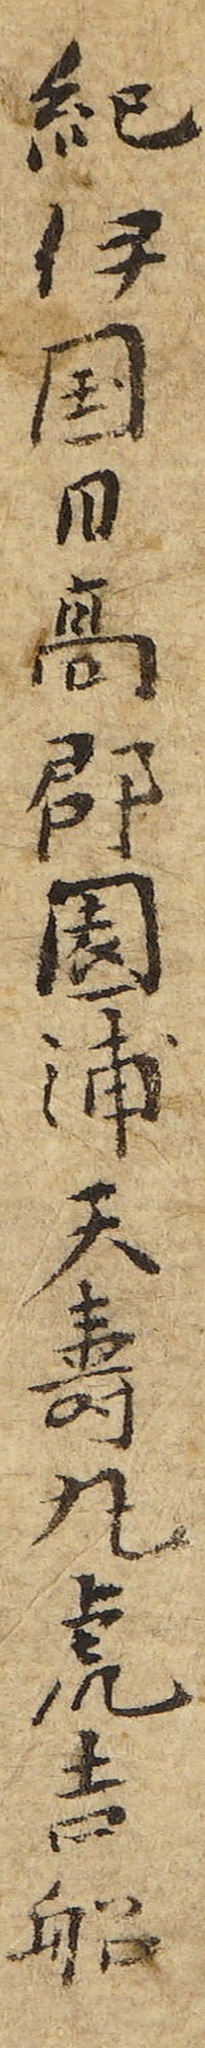紀伊国日高郡園浦天寿丸虎吉船
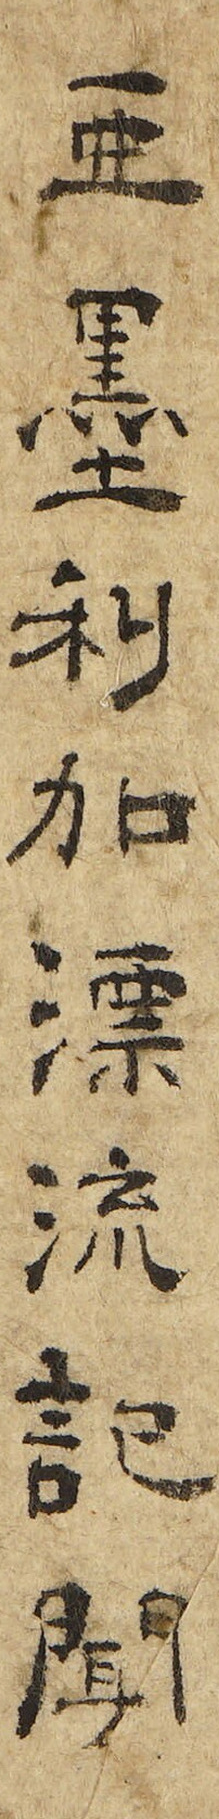亜墨利加漂流記聞
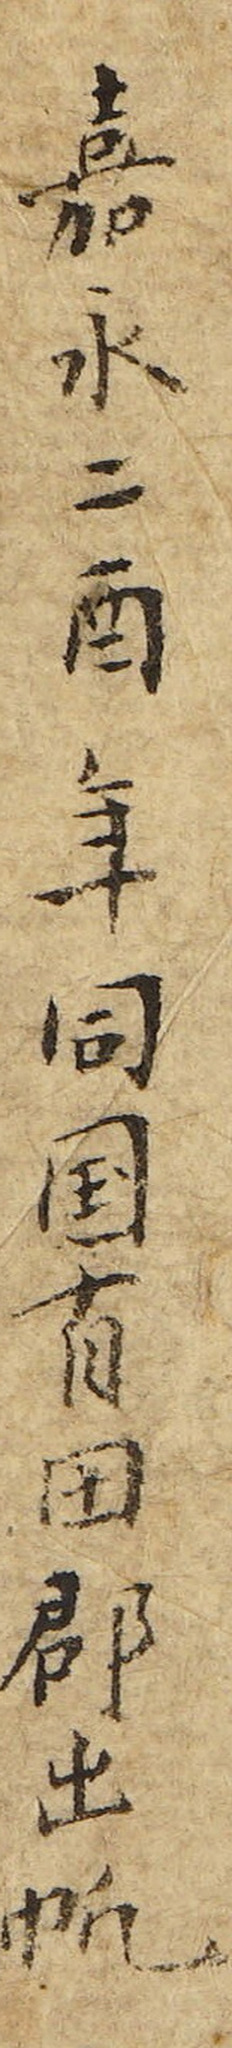嘉永二酉年同国有田郡出帆
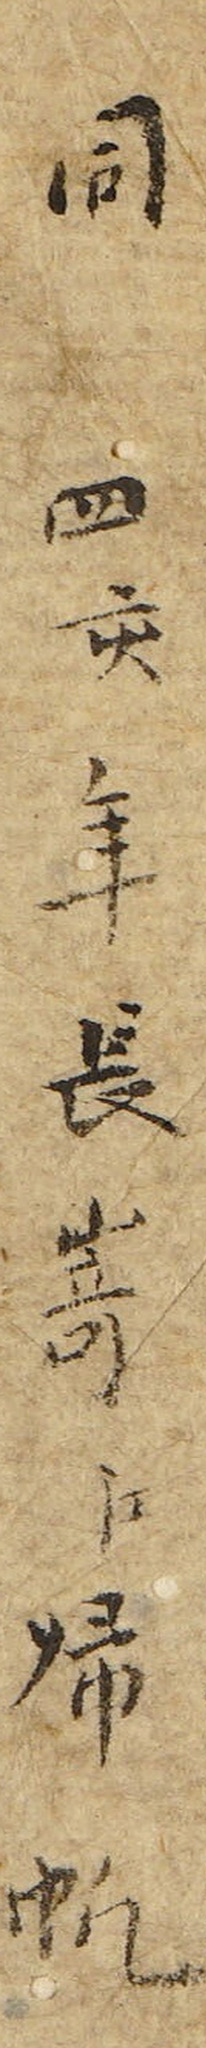同四亥年長崎江帰帆
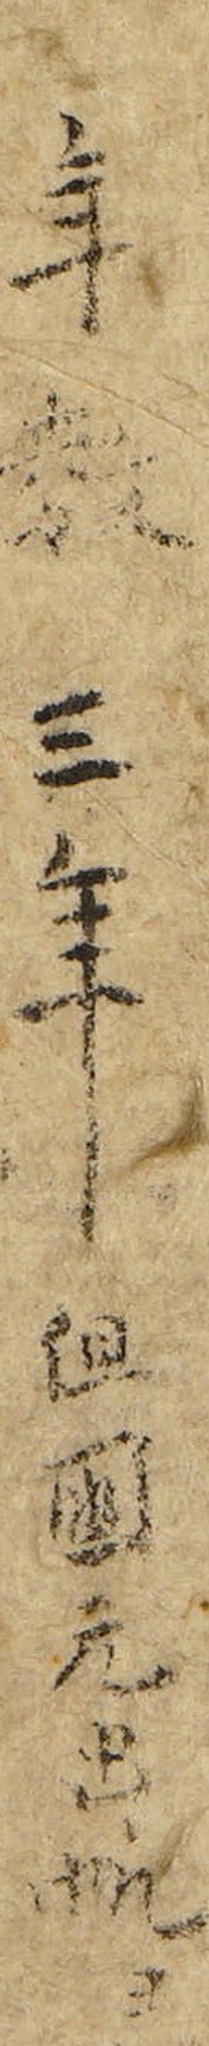年数三年但国元出帆
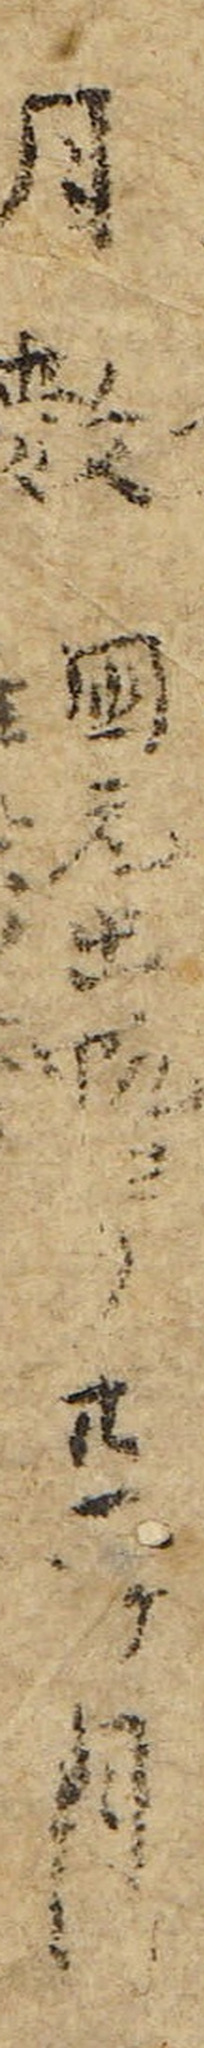月数国元出帆ヨリ廿九ケ月

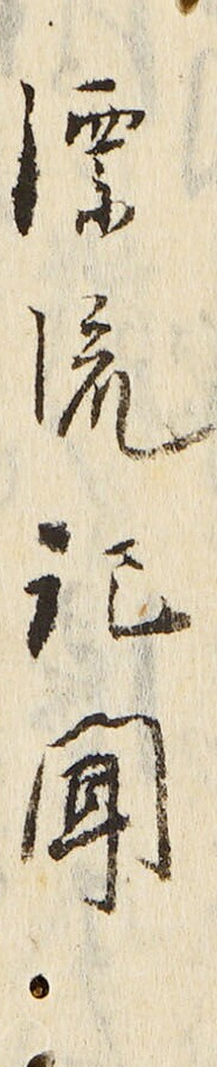漂流記聞
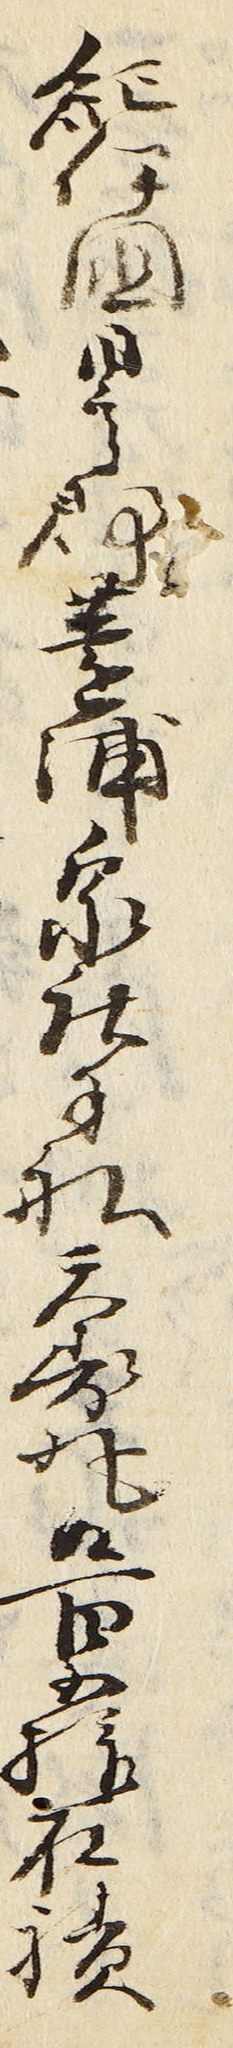紀伊国日高郡薗浦泉庄手船天寿丸九百五拾石積
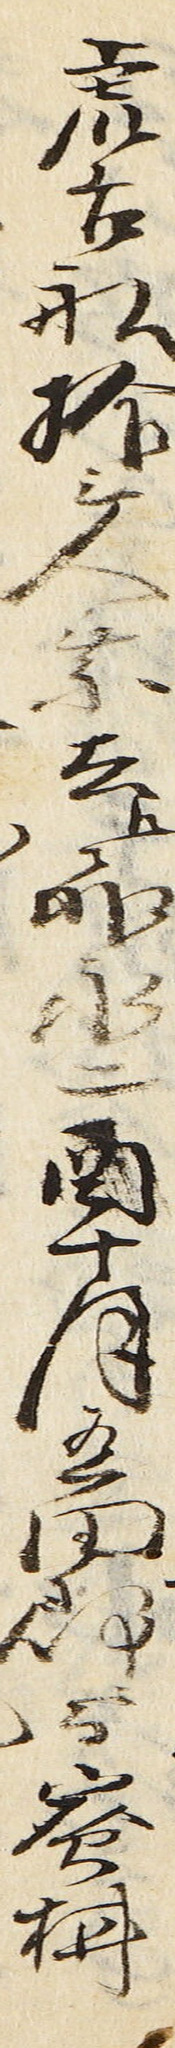虎吉船拾三人乗去ル嘉永二酉十月有田郡に而蜜柑
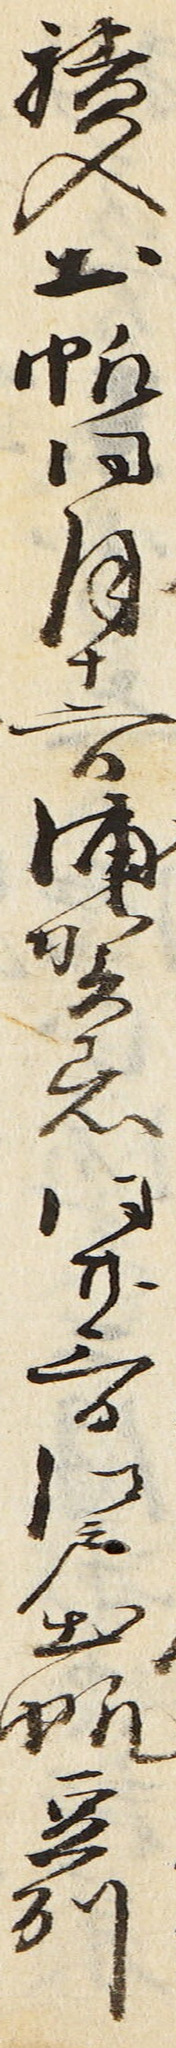積入出帆同月十二日浦賀着同廿三日江戸出帆豆州
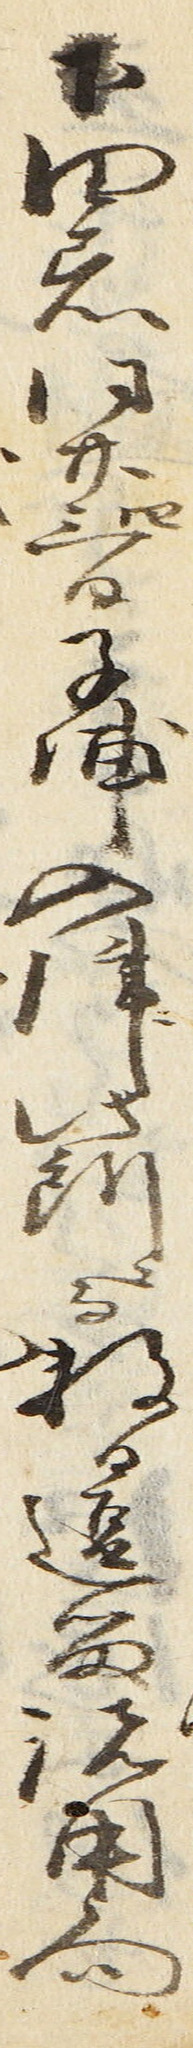下田着同廿三四日子浦入津此所ニ而数日逗留諸用向
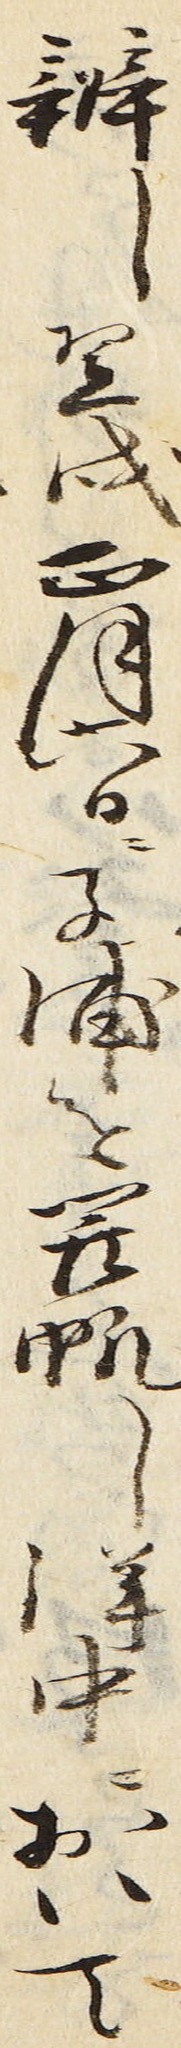弁し翌戌正月六日ニ子浦を開帆し洋中ニおいて
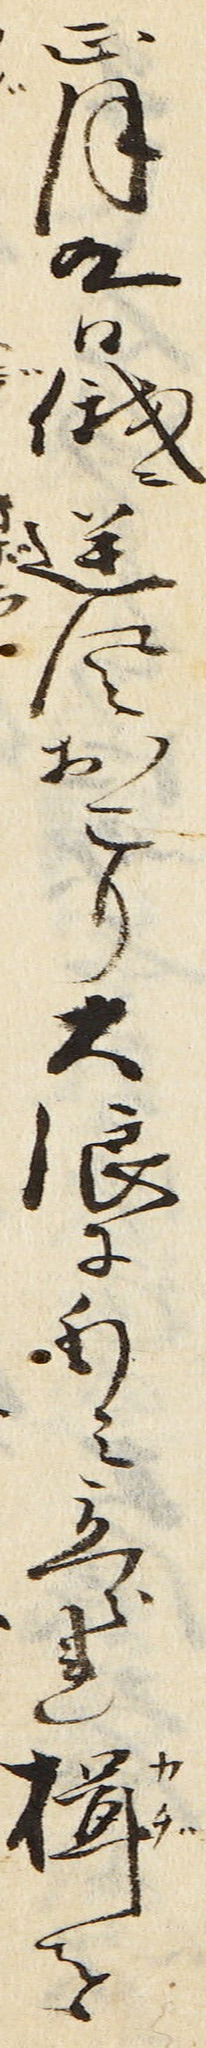正月九日俄ニ送風おこり大浪にもミ立られ楫を
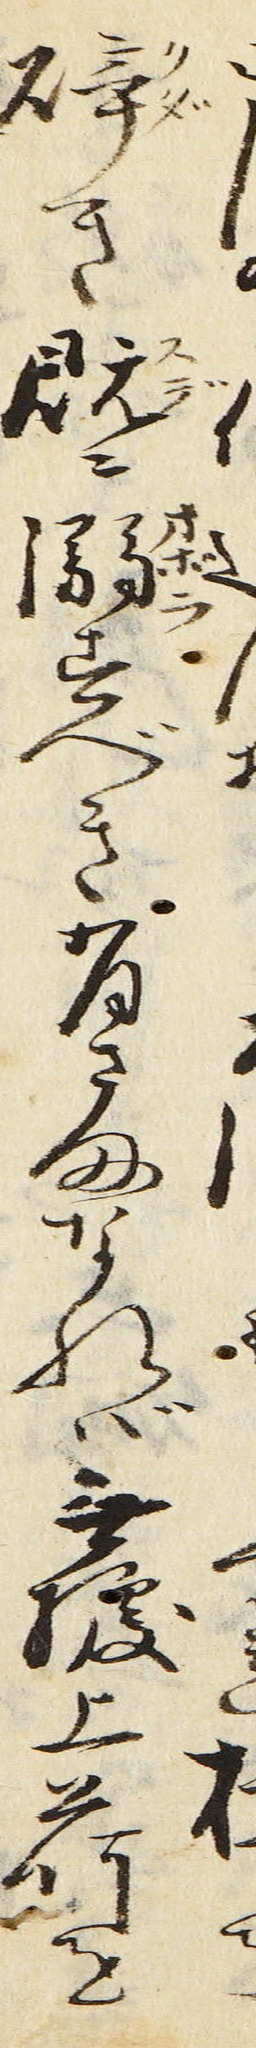砕き既ニ溺すべき有さまなれバ無拠上荷を
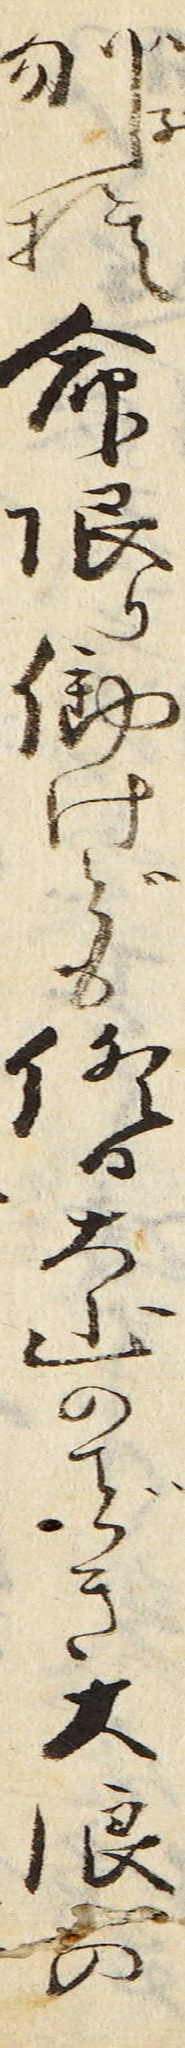刎捨命限り働けども終日大山のごとき大浪の
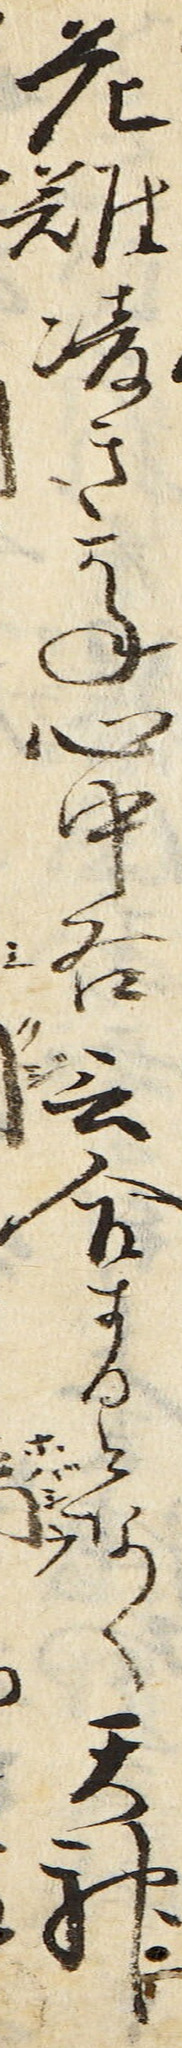差難凌きかね心中各言合するとなく天神
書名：亜墨利加漂流記聞
